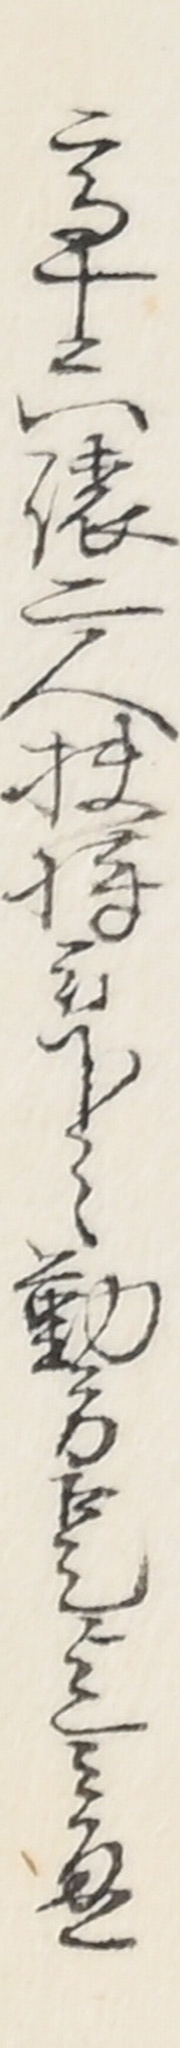高十六俵二人扶持被下之勤方是迄之通
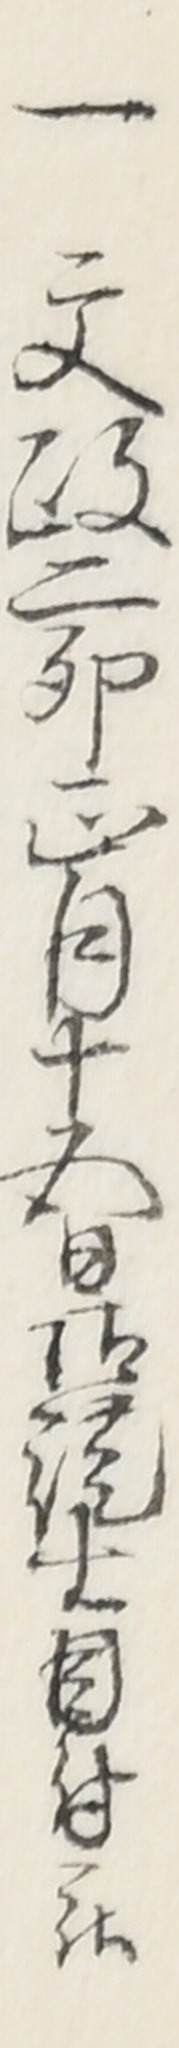一文政二卯正月十五日御徒士目付被
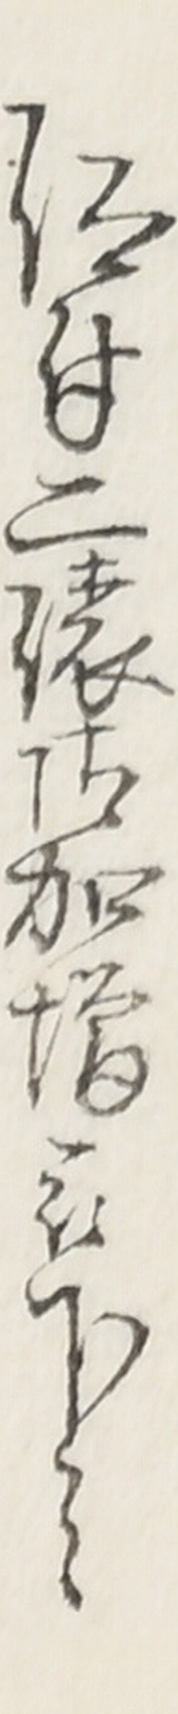仰付二俵御加増被下之
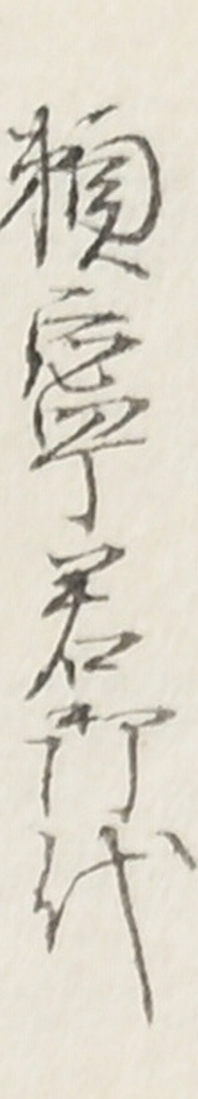頼寧君御代
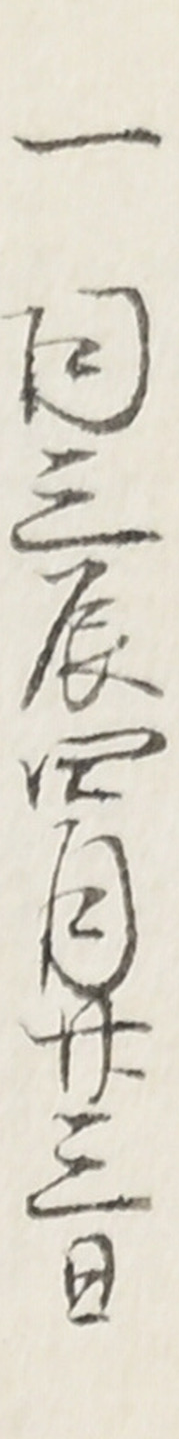一同三辰四月廿三日
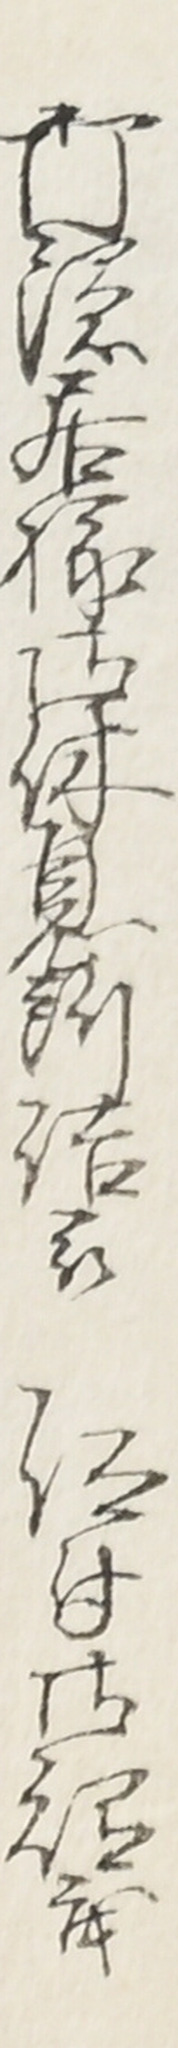御隠居様御休息所詰被仰付御賄茂
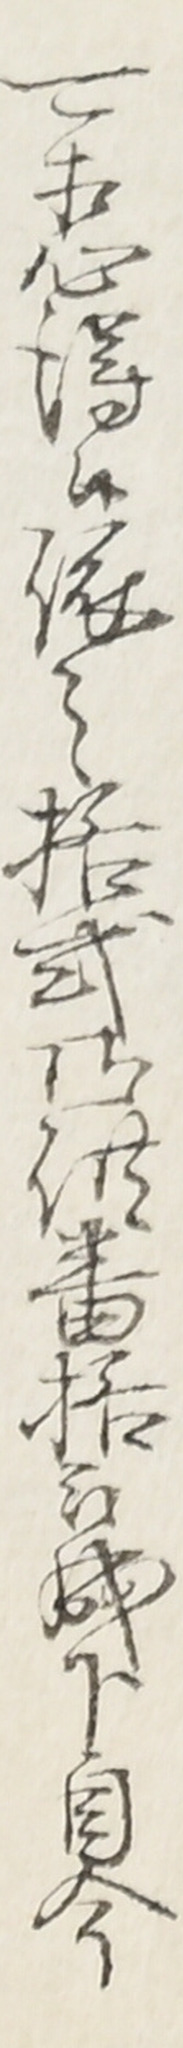可相心得候依之格式御供番格被成下自今
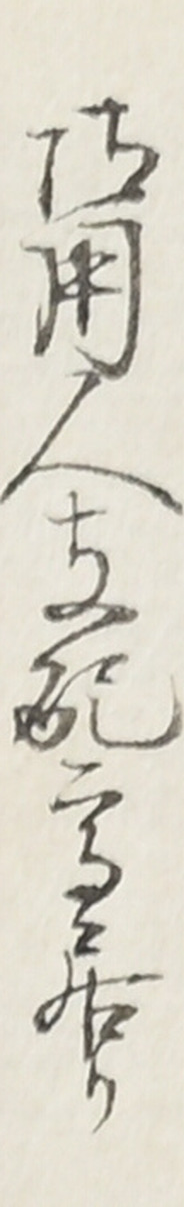御用人支配高居り
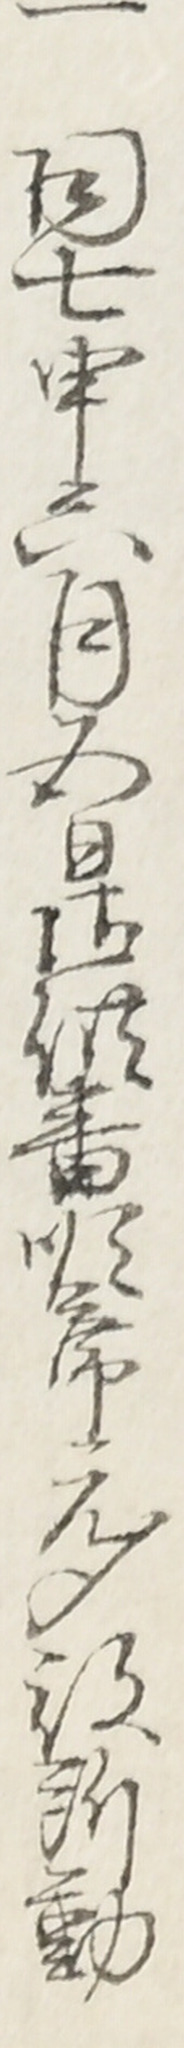一同七申六月五日御供番順席元〆役所勤
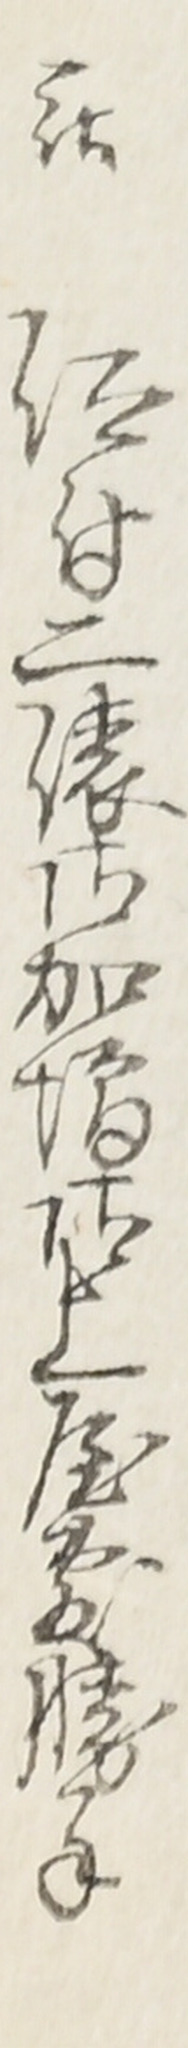被仰付二俵御加増御上屋敷勝手
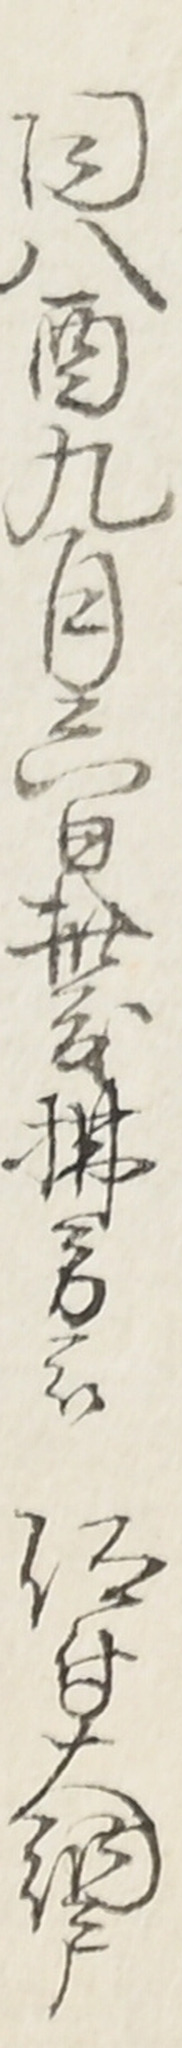一同八酉九月六日此度払方被仰付大納戸
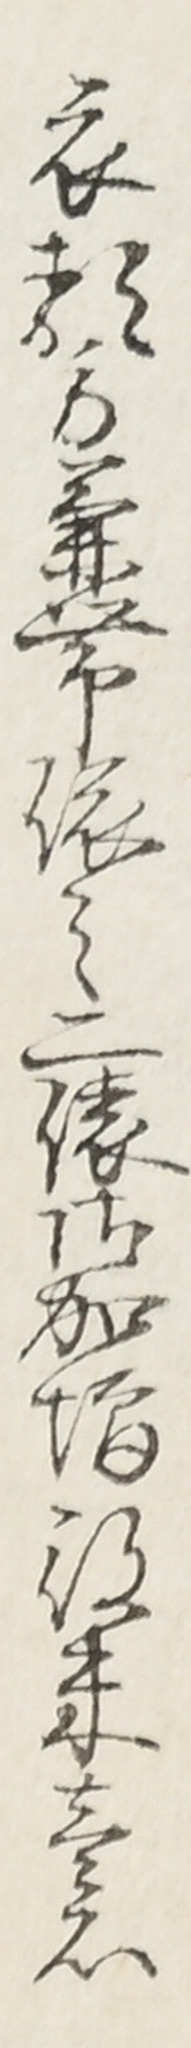衣類方兼帯依之二俵御加増役米壱石
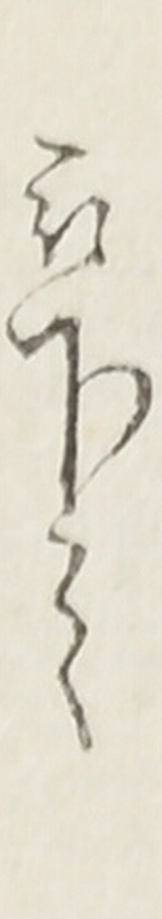被下之
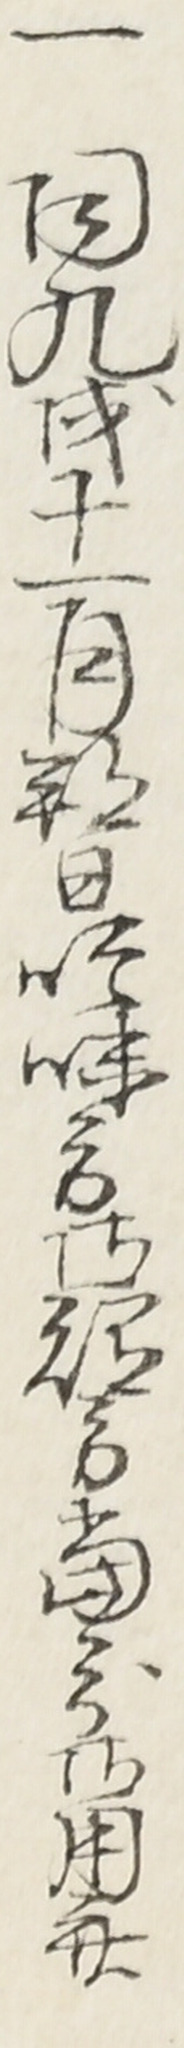一同九戌十一月朔日吟味方御賄方当分御用弁

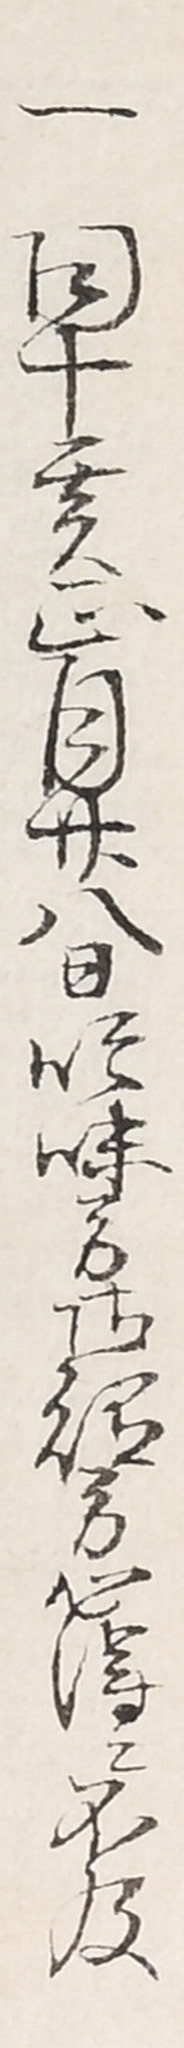一同十亥正月廿八日吟味方御賄方心得ニ不及
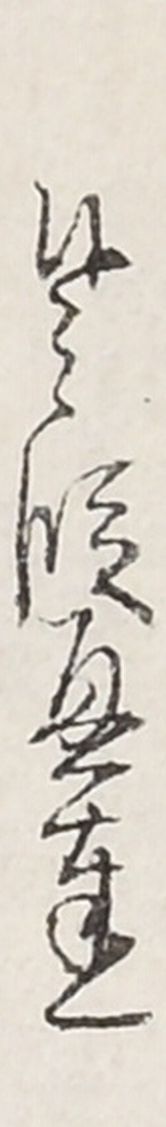候之段通達
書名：無足諸士勤仕録（四）
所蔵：伊那市立高遠町図書館・合同会社AMANE
